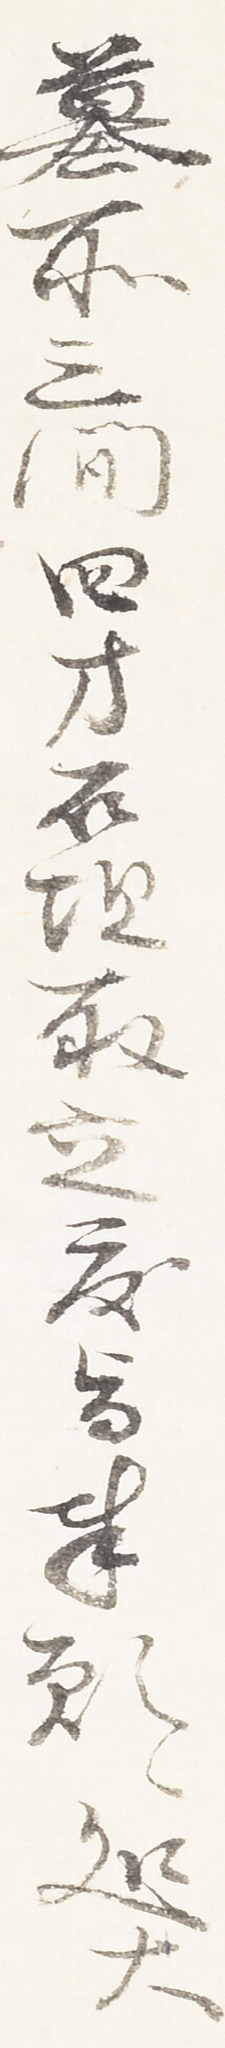墓所三間四方石垣取立度旨奉願候処大
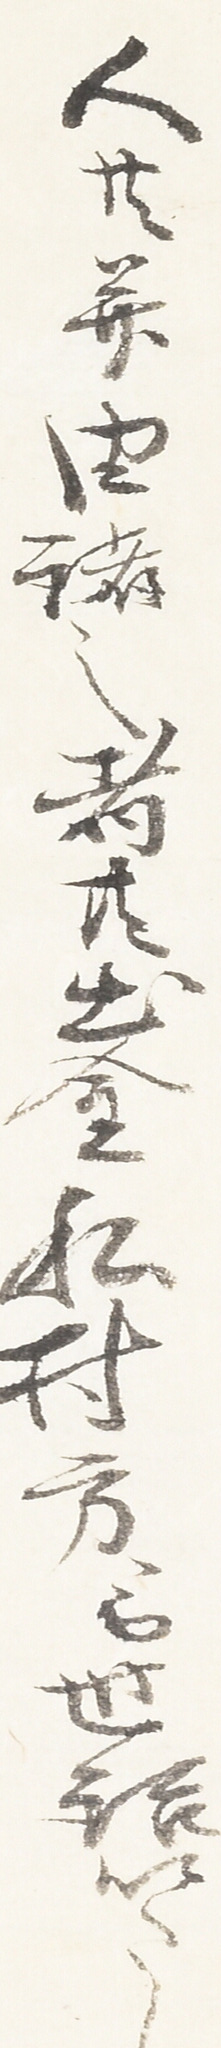人共并由緒之者共出金私村方ニ而世話いたし
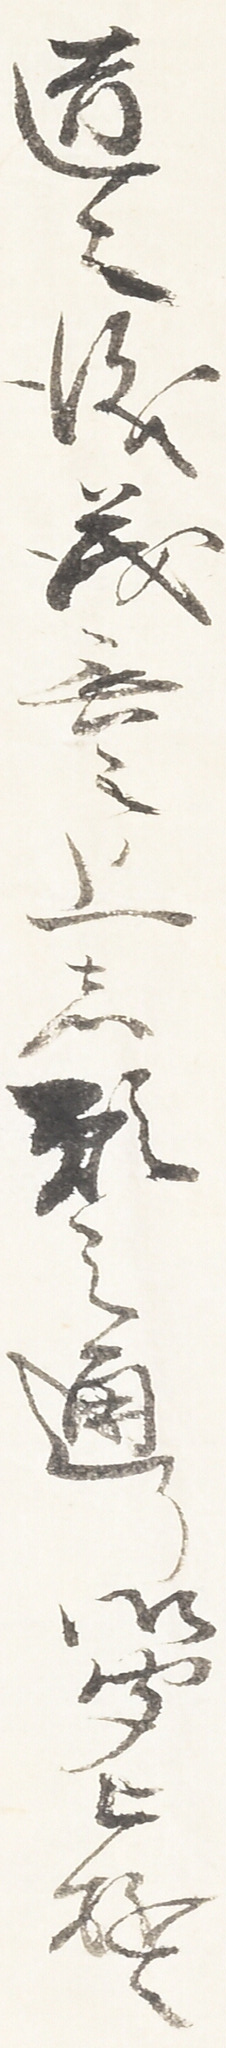造之儀も無之上は願之通り御聞被遊候
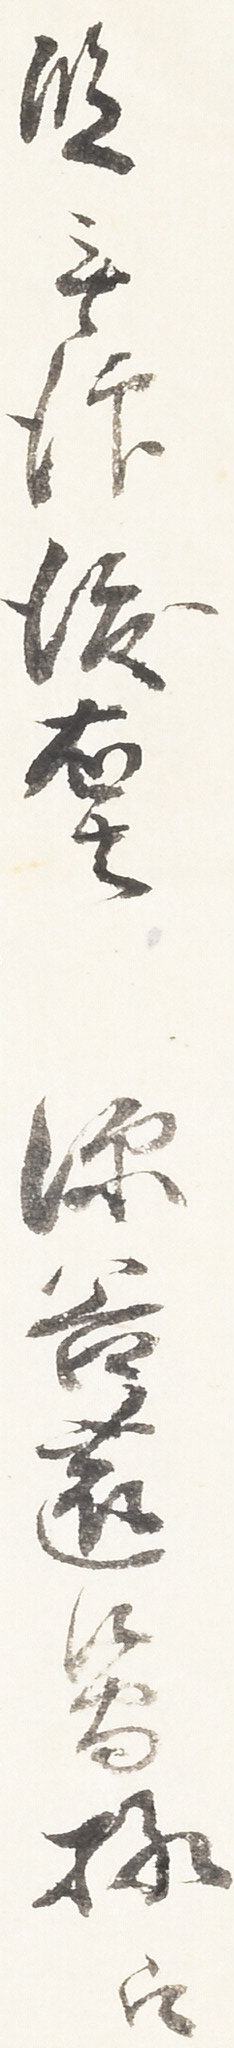段被仰渡右之深谷遠江守様え
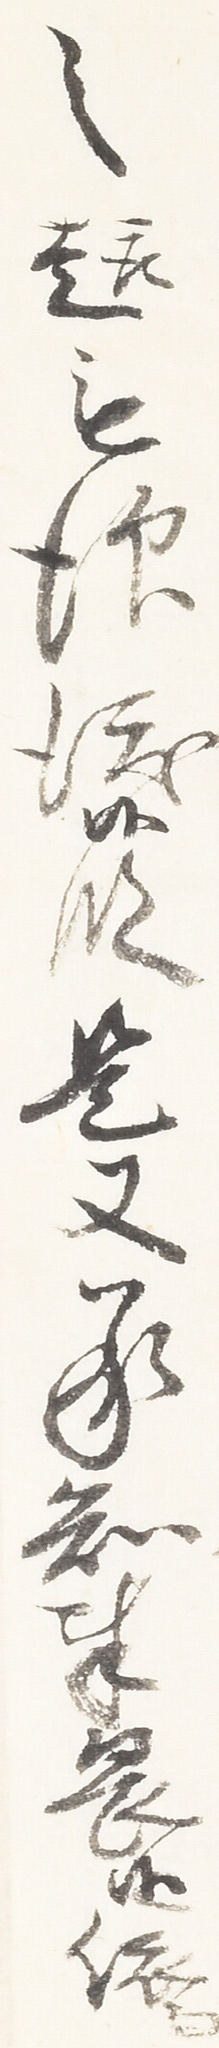之趣被仰渡候段是又承知奉畏候依而
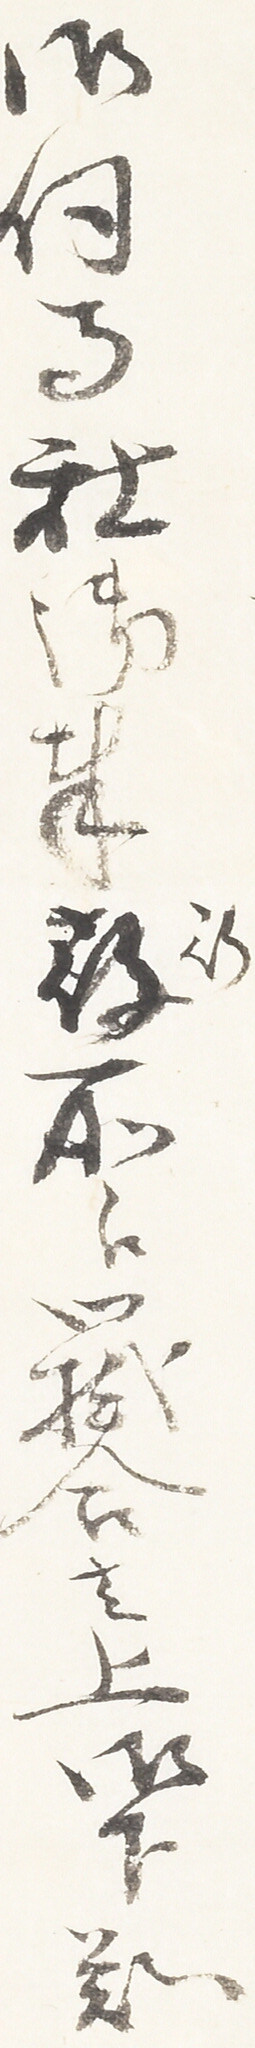御伺寺社御奉行所え御掛合之上御下願
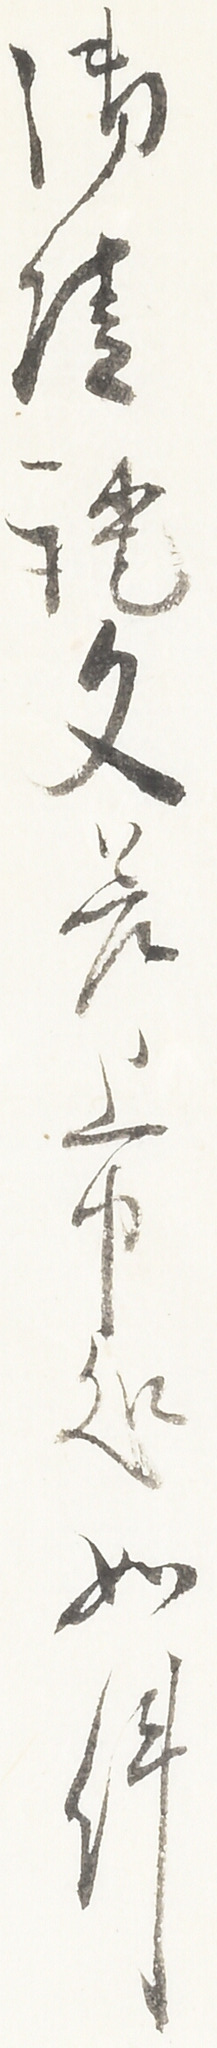御請証文差上申処如件
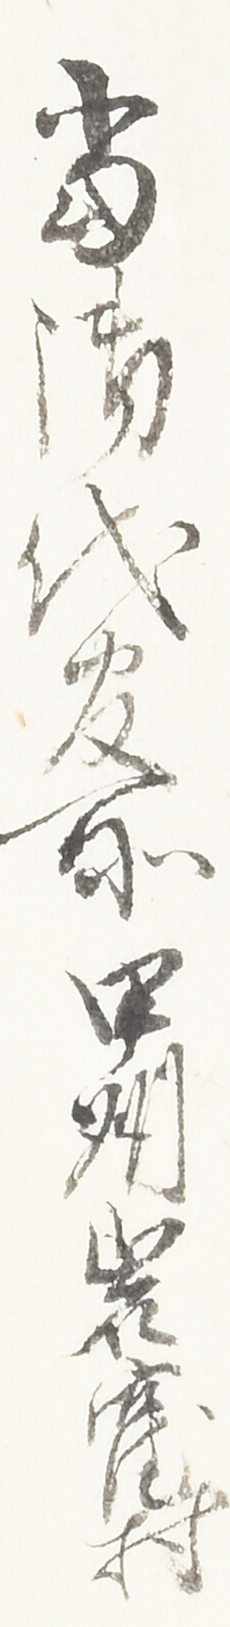当御代官所甲州岩窪村
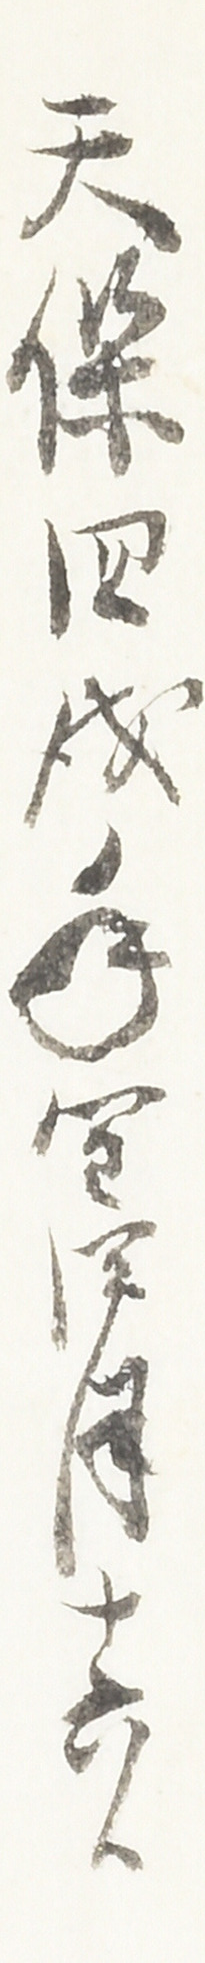天保四戌年閏四月十六日
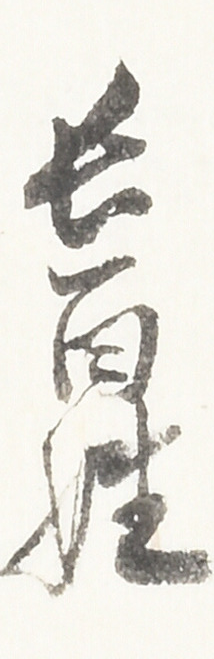長百姓
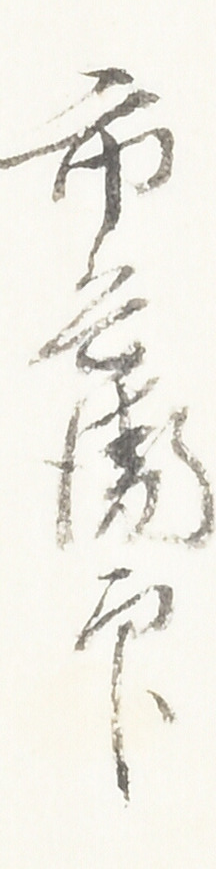市兵衛印
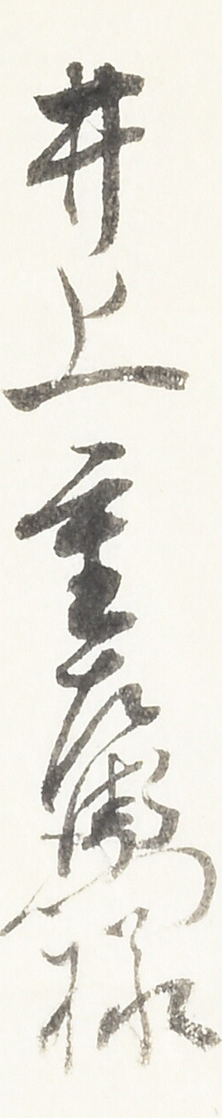井上重左衛門様
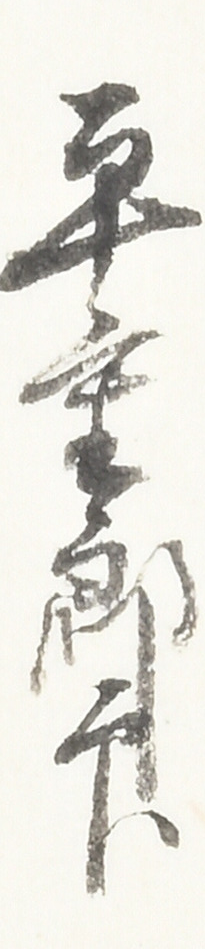平重郎印
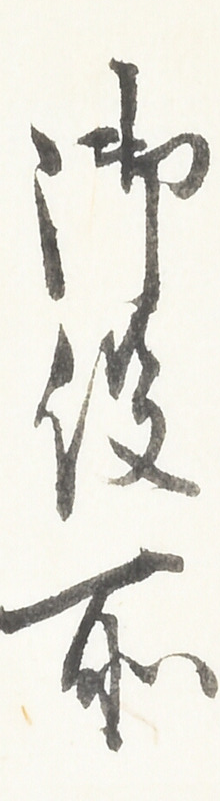御役所
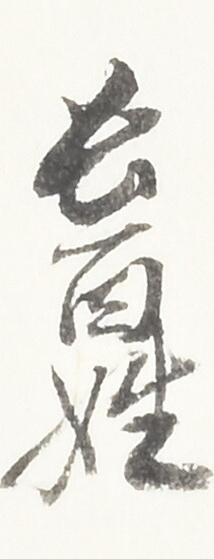長百姓
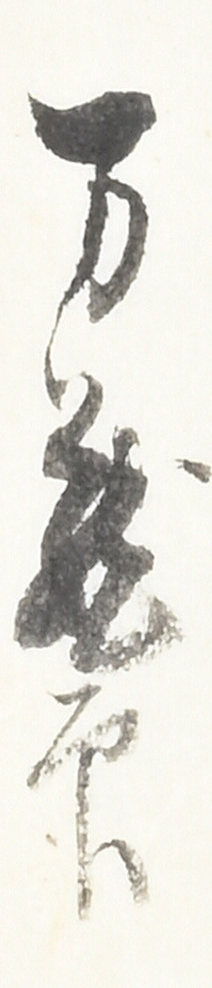万蔵印
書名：岩窪廟取（所）墓碑囲石垣取建伺書
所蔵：伊那市立高遠町図書館・合同会社AMANE
